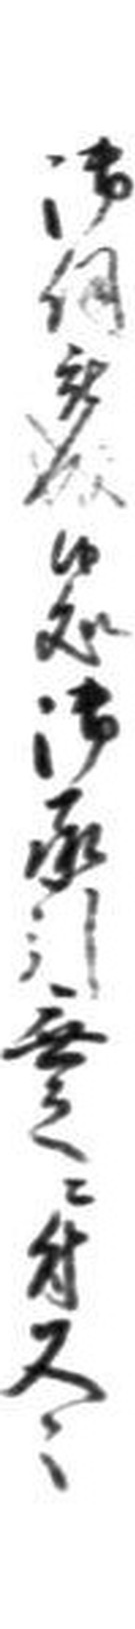御伺被成候処御承引無之ニ付又々
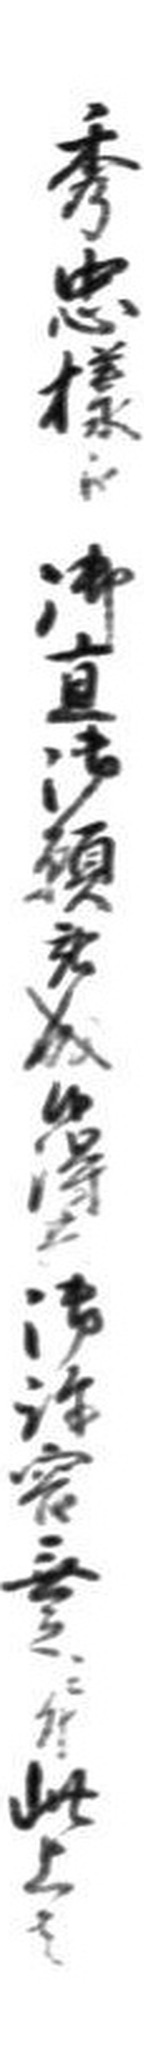秀忠様江御宜御願被成候得共御許容無之ニ付此上者
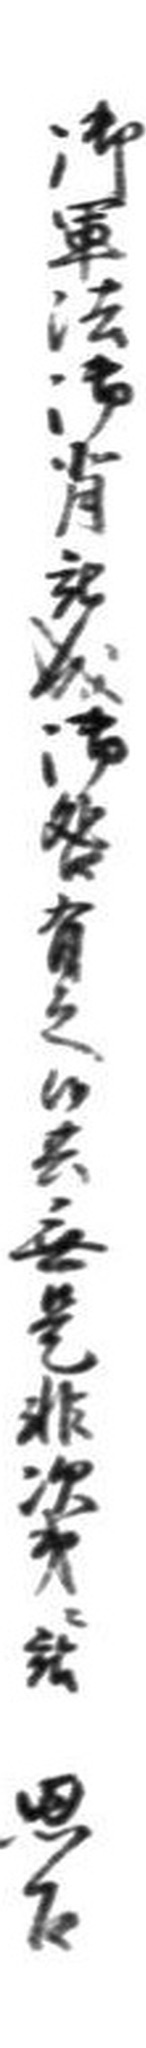御軍法御背被成御咎有之候共無是非次第ニ被思召
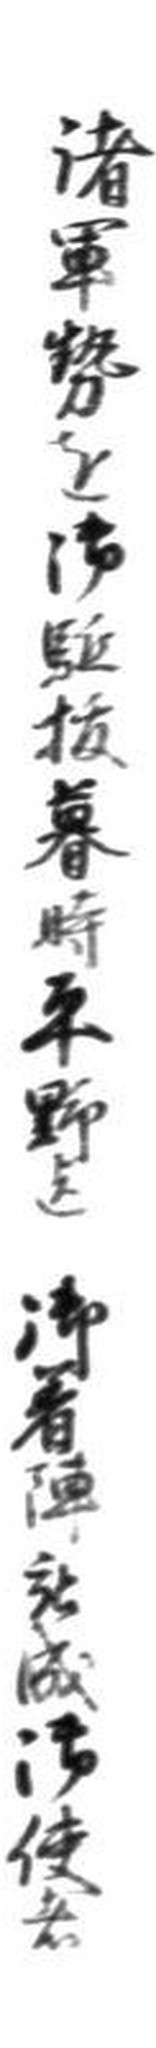諸軍勢を御駈抜暮時平野迄御着陣被成御使者
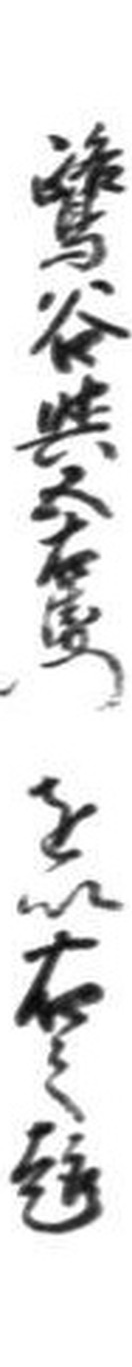鷺谷與五右衛門を以右之趣
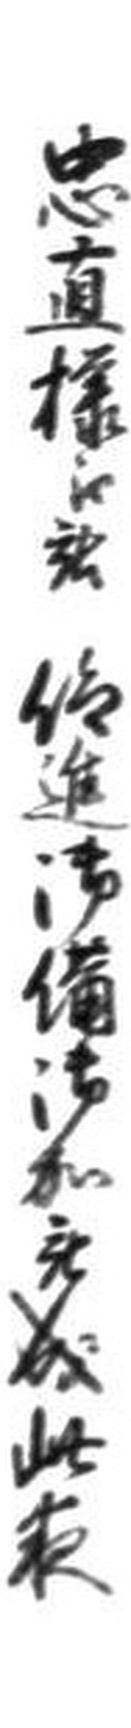忠直様江被仰進御備御加被成此夜

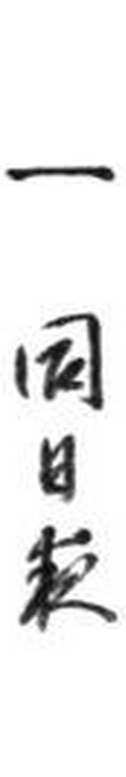一同日夜
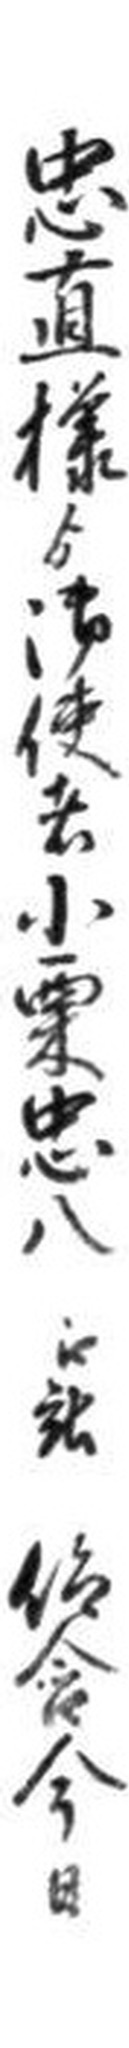忠直様ゟ御使者小栗忠八江被仰含今日
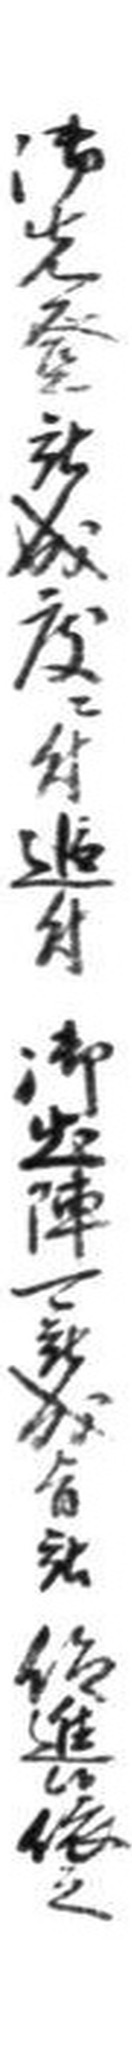御先発被成度ニ付追付御出陣可被成旨被仰進候依之
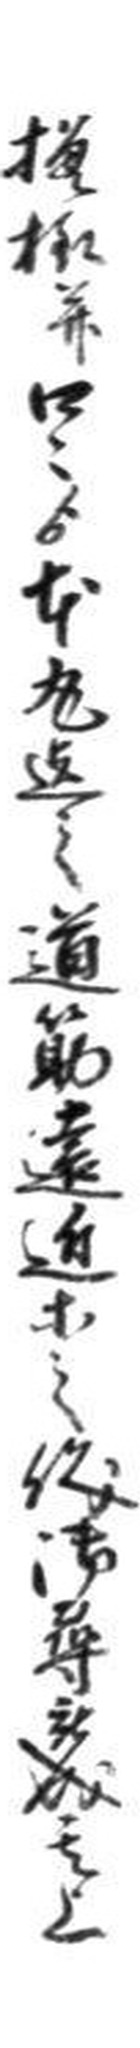模様并口々ゟ本丸迄之道筋遠近等之儀御尋被成其上
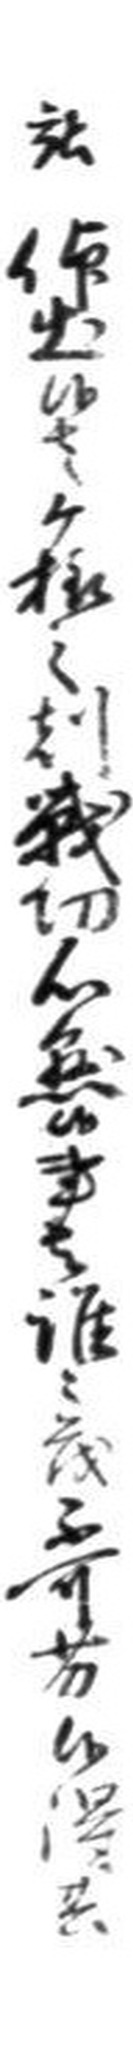被仰出候者ケ様之刻戦功心懸候事者誰ニも不可劣候得共
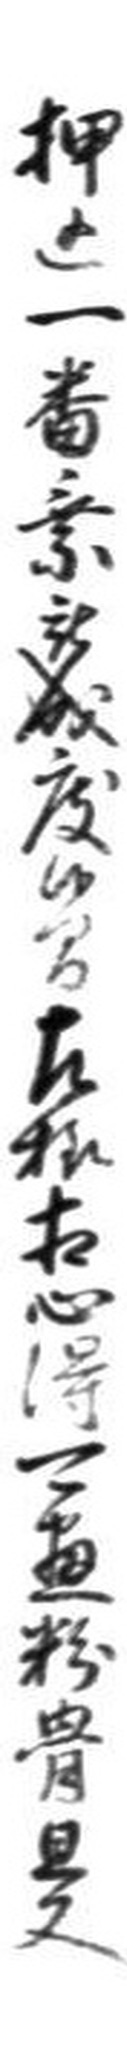押込一番乗被成度候間左様相心得可尽粉骨且又
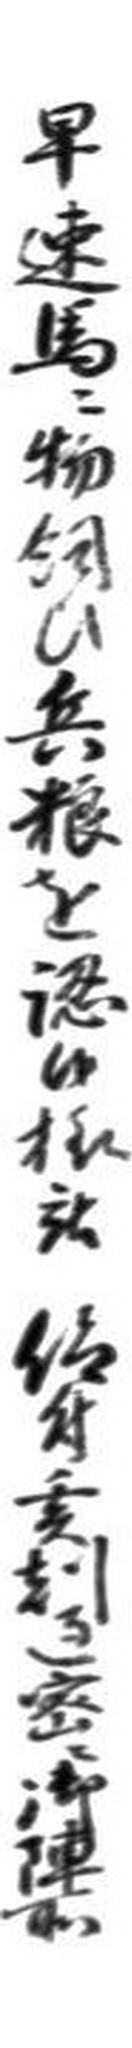早速馬ニ物飼ひ兵糧を認候様被仰付亥刻過密ニ御陣取
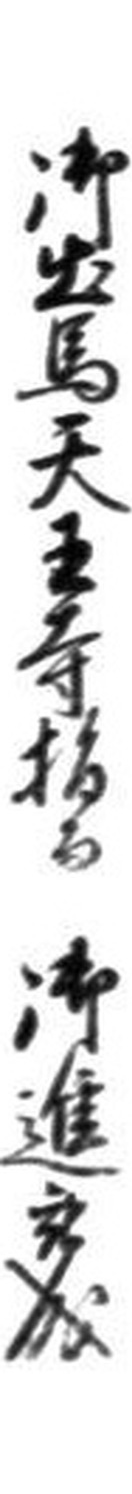御出馬天王寺指而御進被成
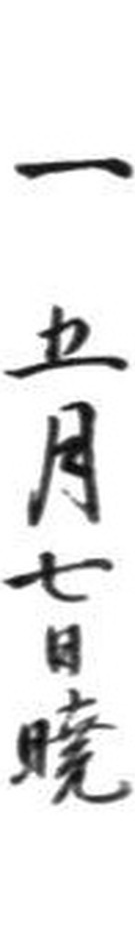一五月七日暁
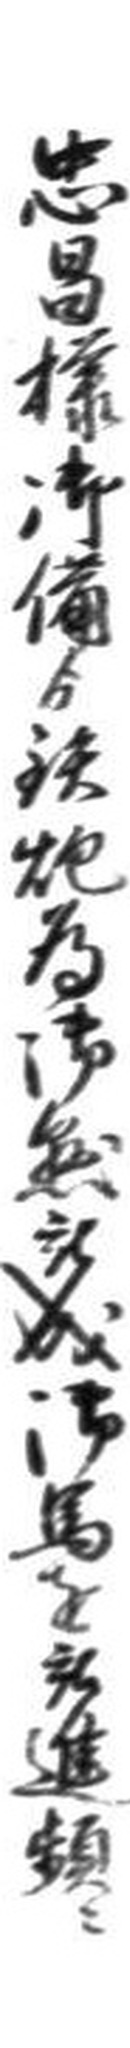忠昌様御備ゟ鉄炮為御懸被成御馬を被進頻ニ
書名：家譜 三 忠昌公 従慶長八年到寛永六年
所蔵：福井県文書館 Fukui Prefectural Archives
